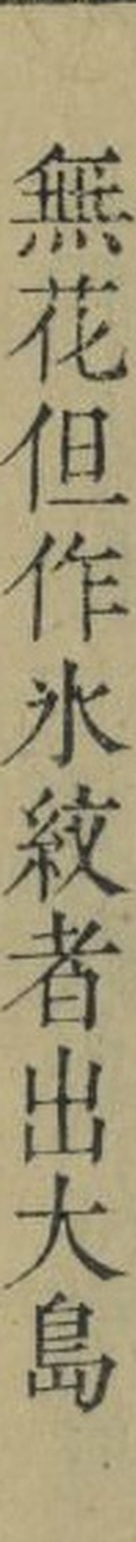無花但作氷紋者出大島
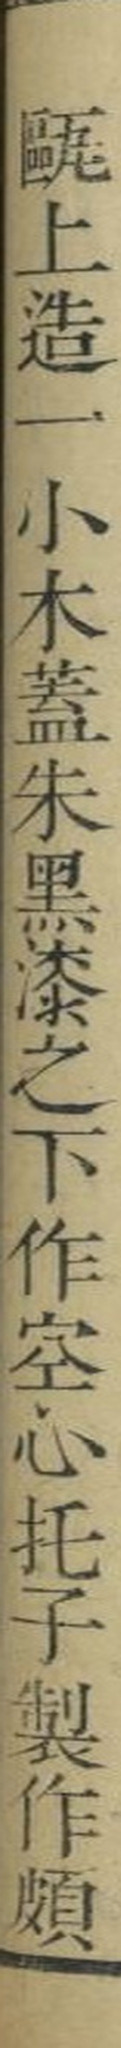甌上造一小木蓋朱黒漆之下作空心托子製作頗
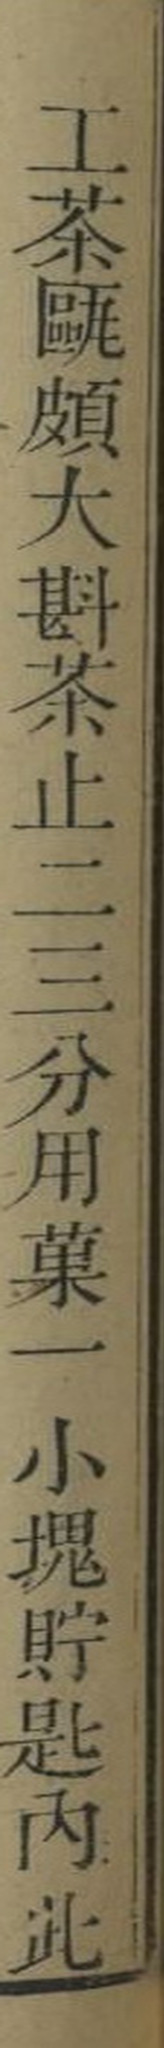工茶甌頗大斟茶止二三分用菓一小塊貯匙内此
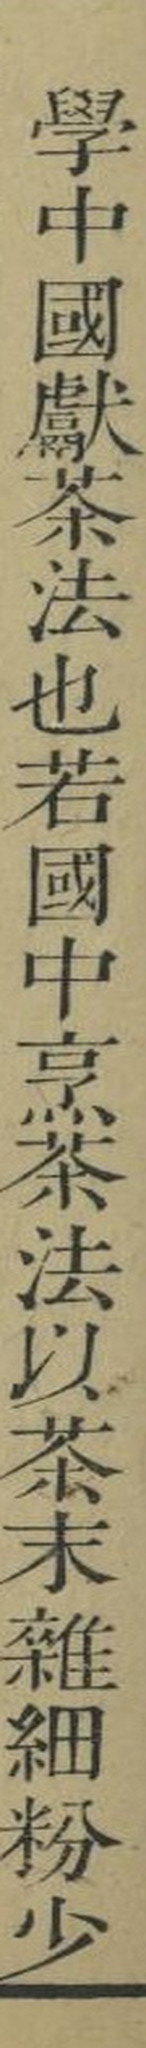学中国献茶法也若国中烹茶法以茶末雑細粉少
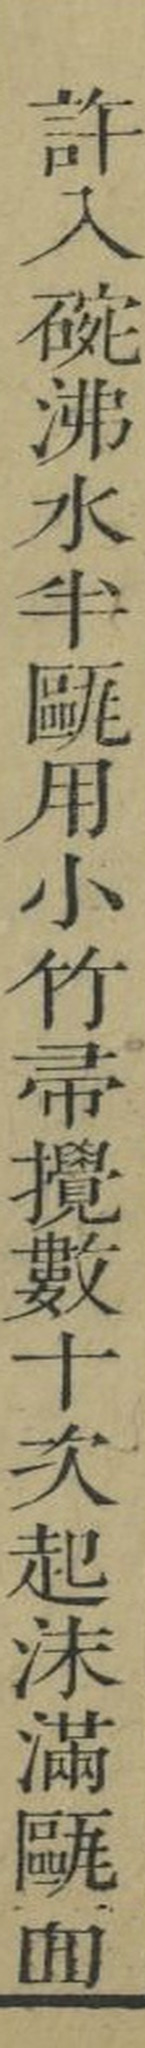許入碗沸水半甌用小竹帚攪数十次起沫満甌面
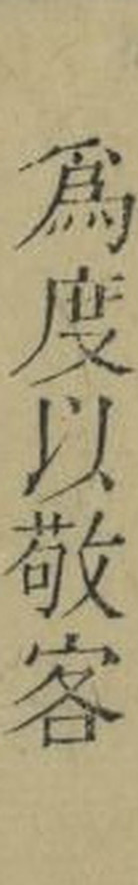為度以敬客

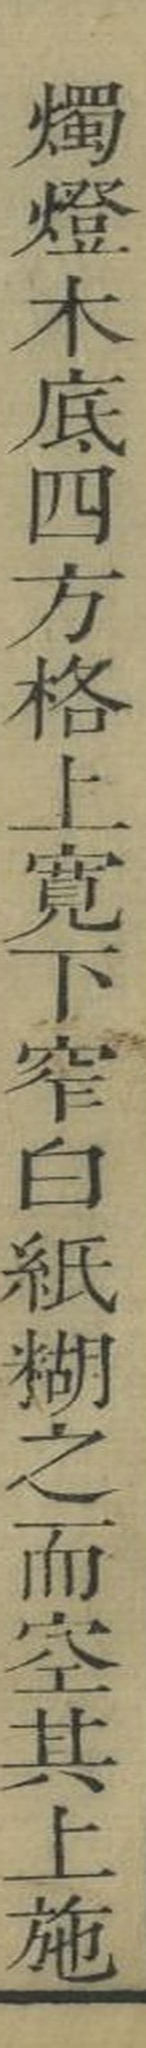燭灯木底四方格上寛下窄白紙糊之而空其上施
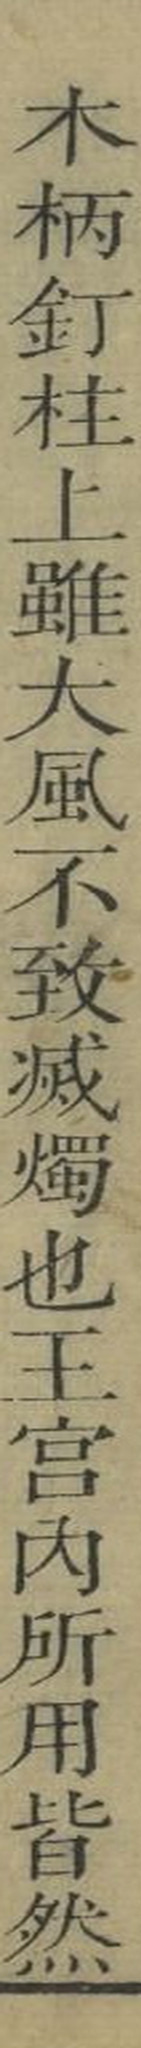木柄釘柱上雖大風不致滅燭也王宮内所用皆然
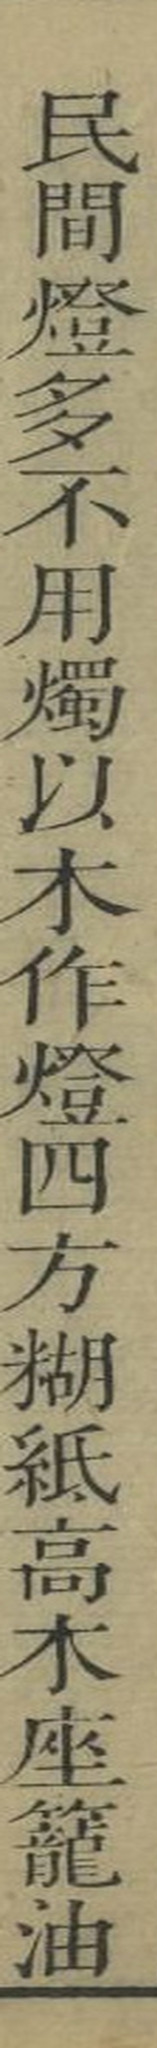民間灯多不用燭以木作灯四方糊紙高木座篭油
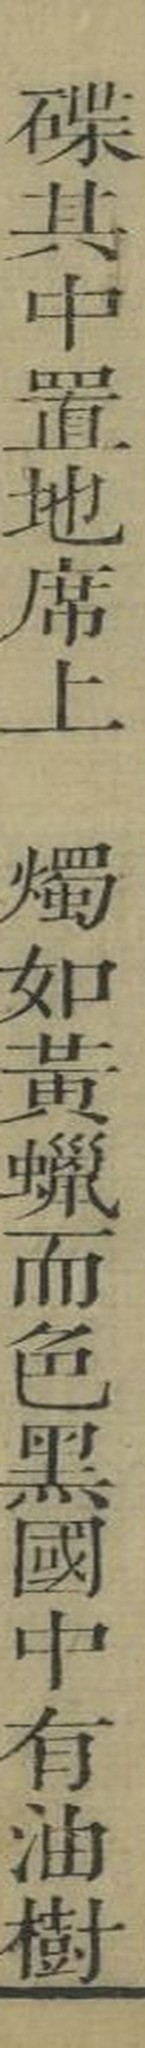碟其中置地席上燭如黄蝋而色黒国中有油樹
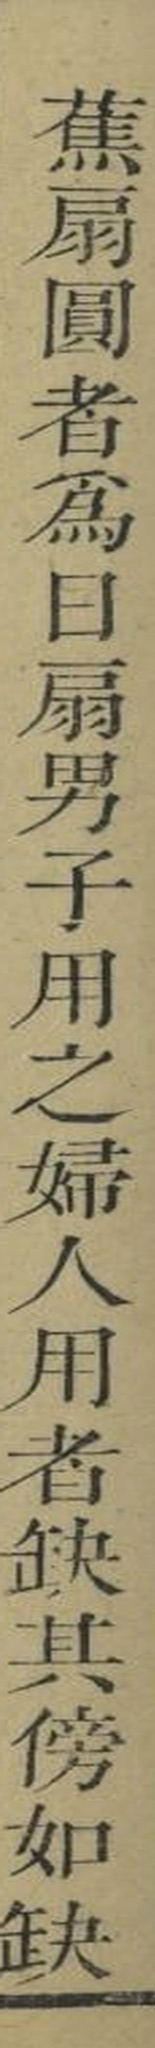蕉扇円者為日扇男子用之婦人用者欠其傍如欠
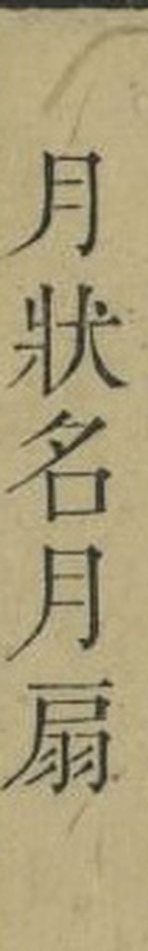月状名月扇
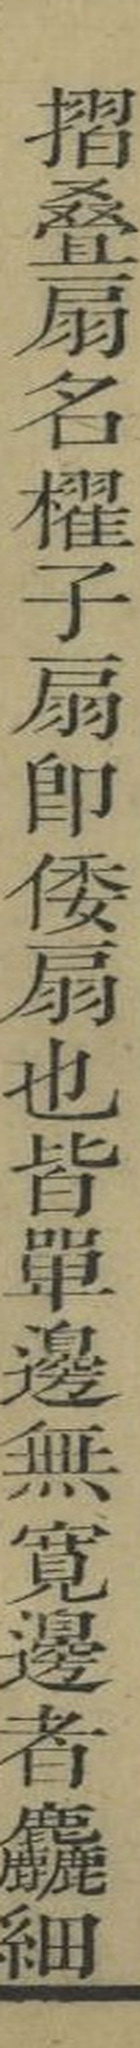摺畳扇名櫂子扇即倭扇也皆単辺無寛辺者麤細
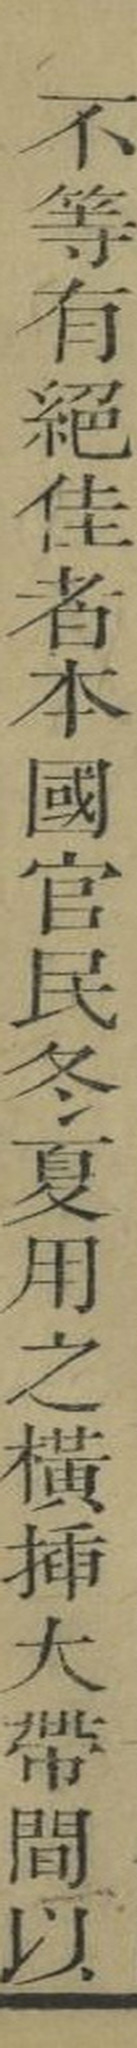不等有絶佳者本国官民冬夏用之横揷大帯間以
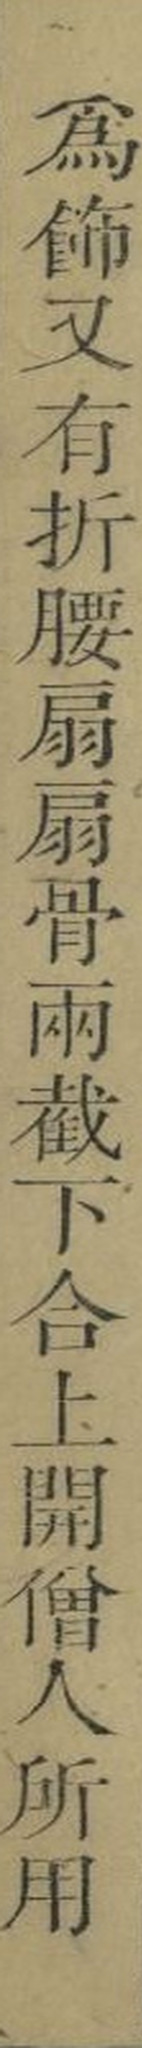為飾又有折腰扇扇骨両截下合上開僧人所用

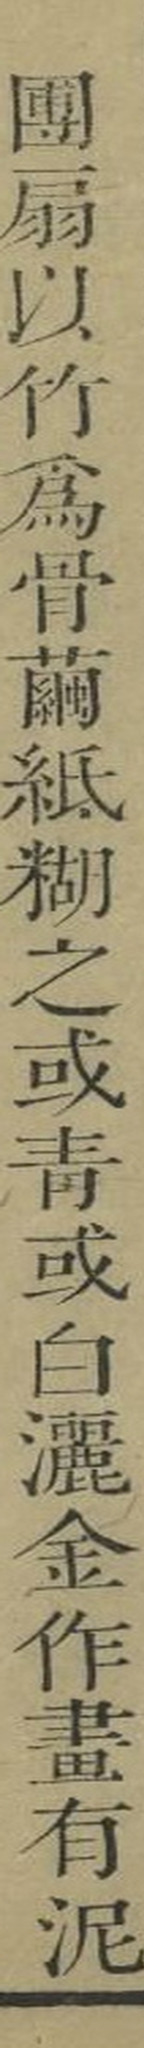団扇以竹為骨繭紙糊之或青或白灑金作画有泥
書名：中山伝信録 巻六
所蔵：University of the Ryukyus Library
